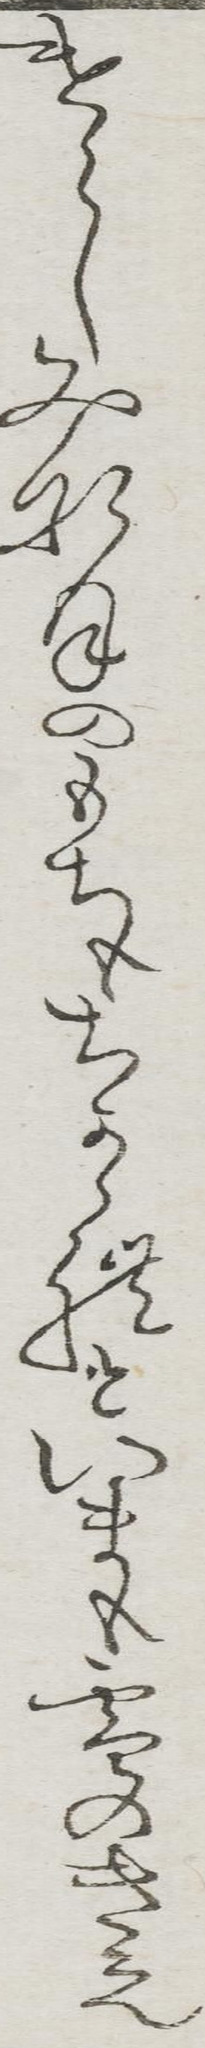けらしみな月のもちもちかゝれといまも雪のきえ
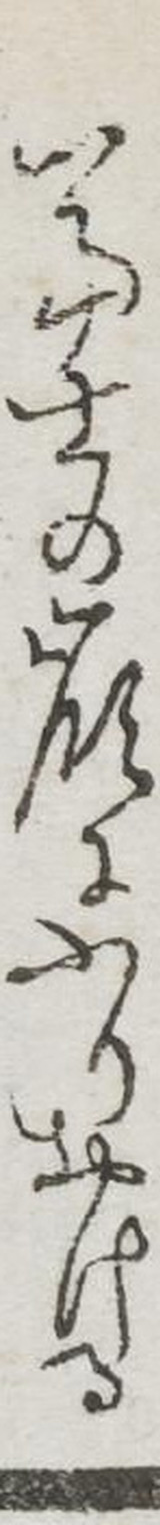富士の峯にふりおける
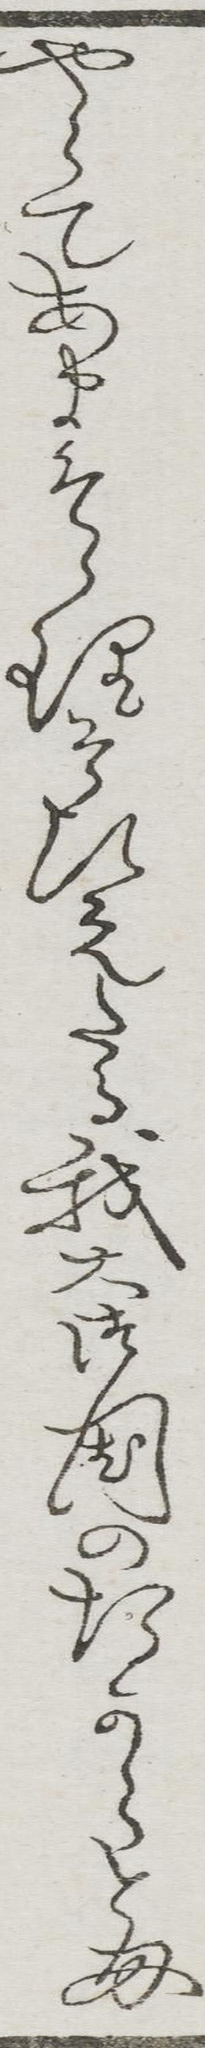やらてあまそゝりそひえたる我大御国のたからとも
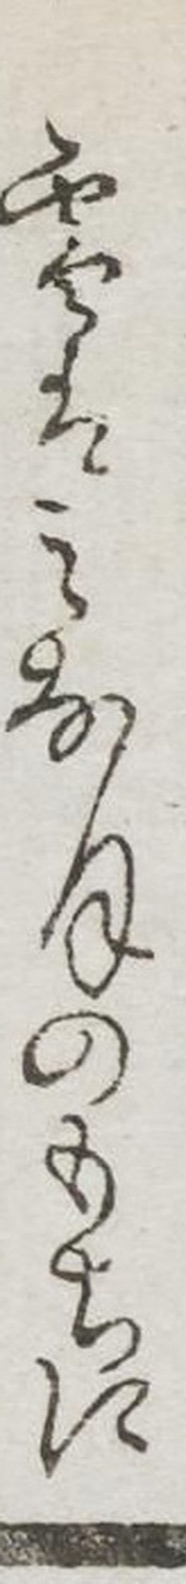雪はみな月のもちに
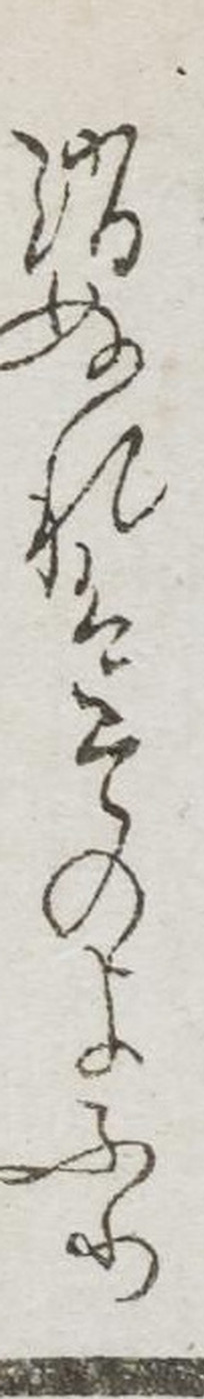消ぬれはそのよふり
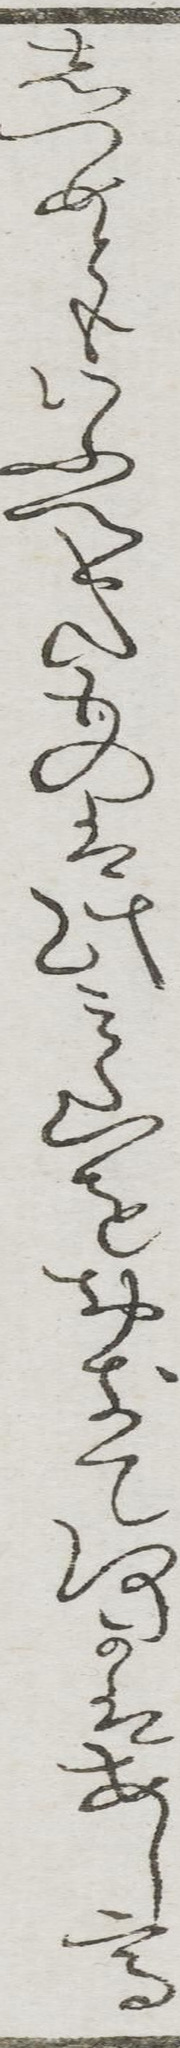しつめともいふへきものは此み山をおきて何かはあし高
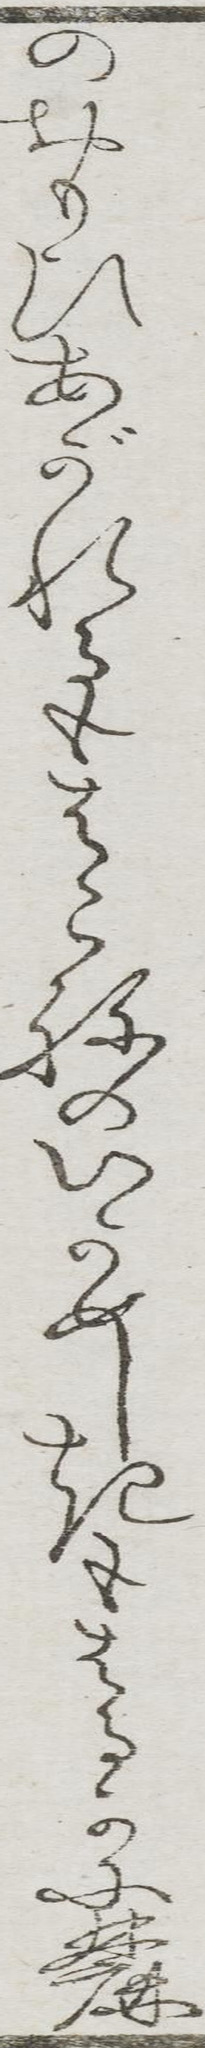のおもひあがれるもはこねのいかめしきもはるかに麓
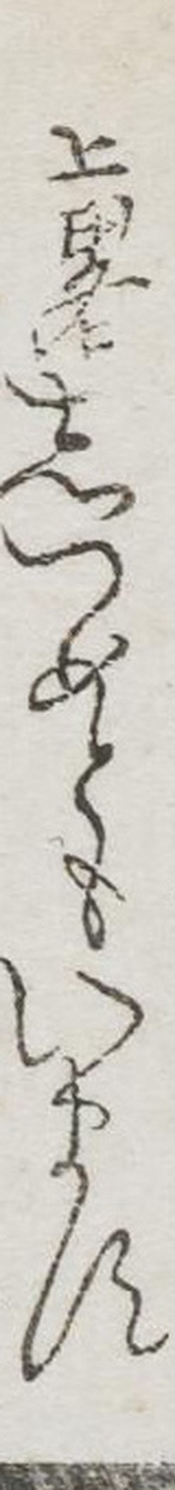上略しつめともいます
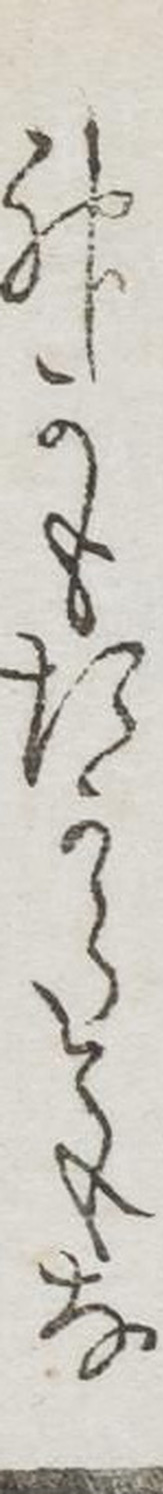神かもたからともな
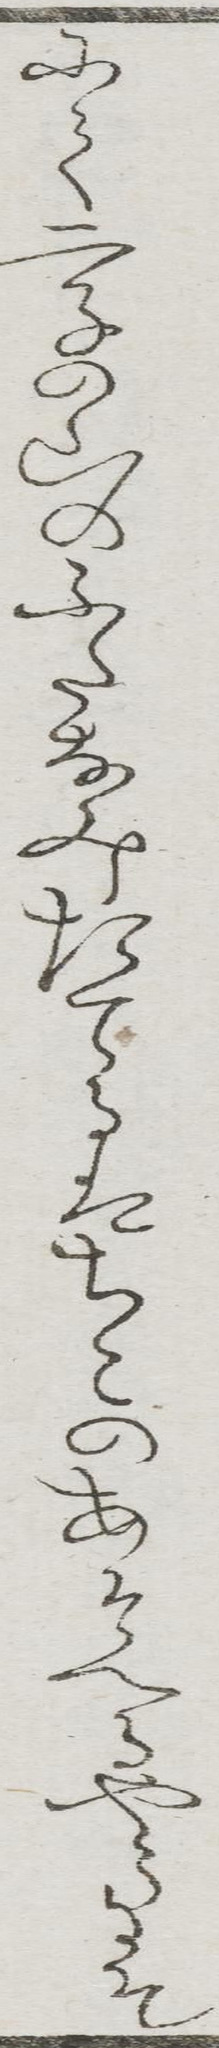にて二子の山のふたなみたてるはちこのあそへるやうにそ
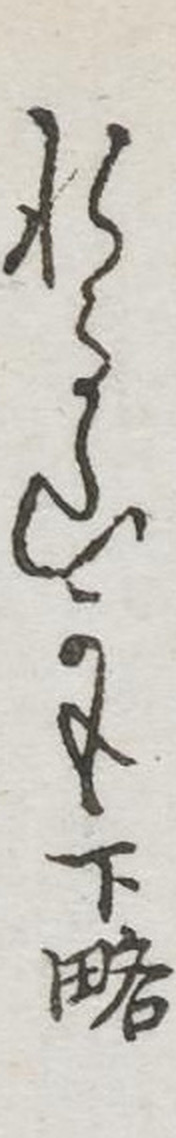れる山かも下略
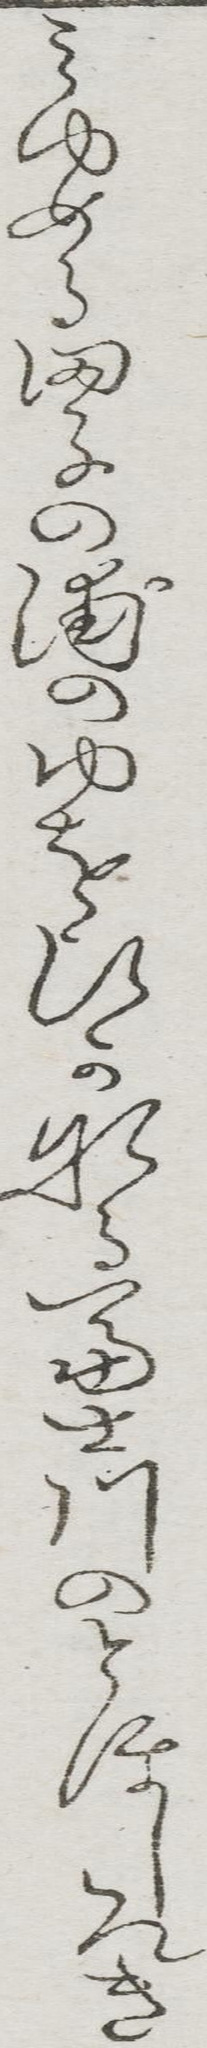みゆめる田子の浦のゆをひかなる富士川のとほしろき
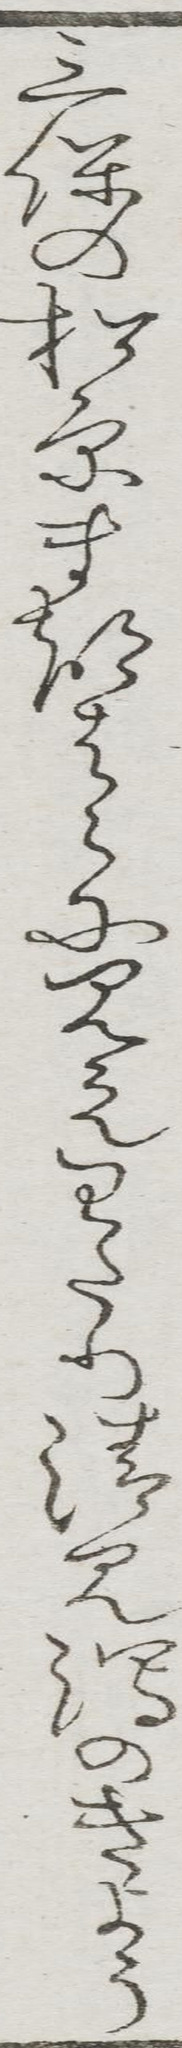三保の松原まつはらに見えわたり清見潟のきよう
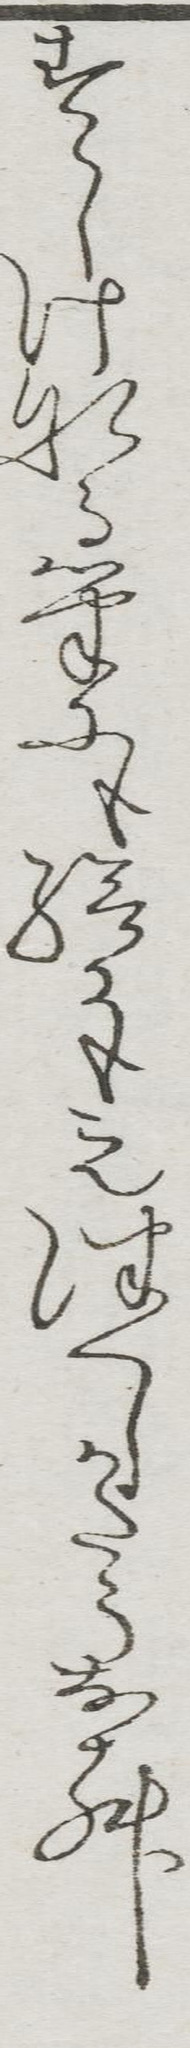すゝしけなる筆にも絵にもえつくしかたうなむ
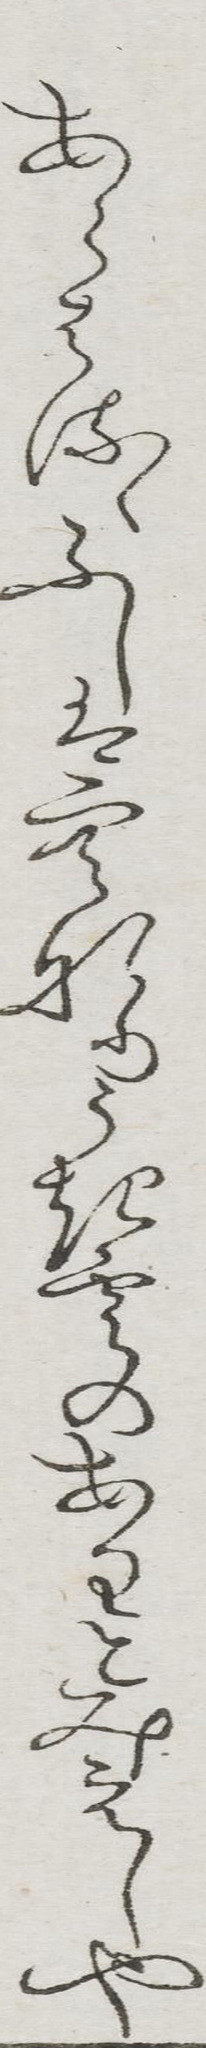あらはるゝふしは空なりうき雲のあわとみえしや
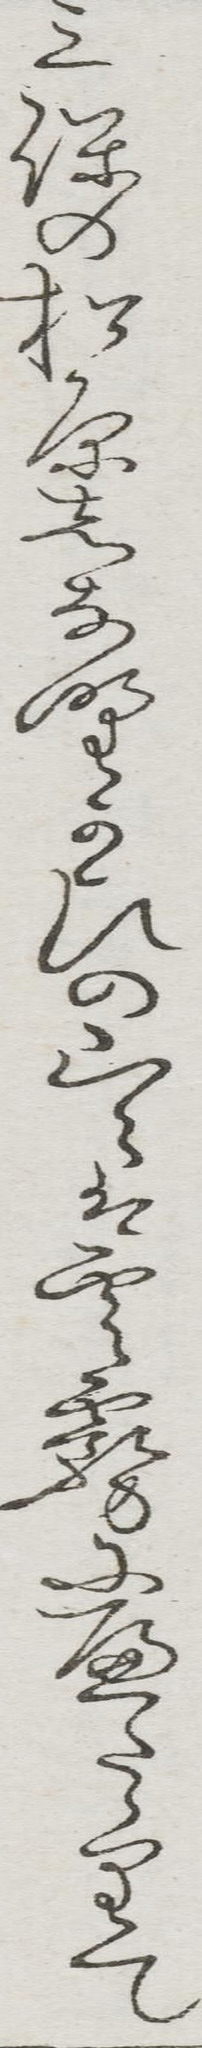三保の松原しな野かひの山々は雲霧にへたゝりて
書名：挿画熱海日記　全
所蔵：東京大学地震研究所図書室 Earthquake Research Institute Library, The University of Tokyo, JAPAN
